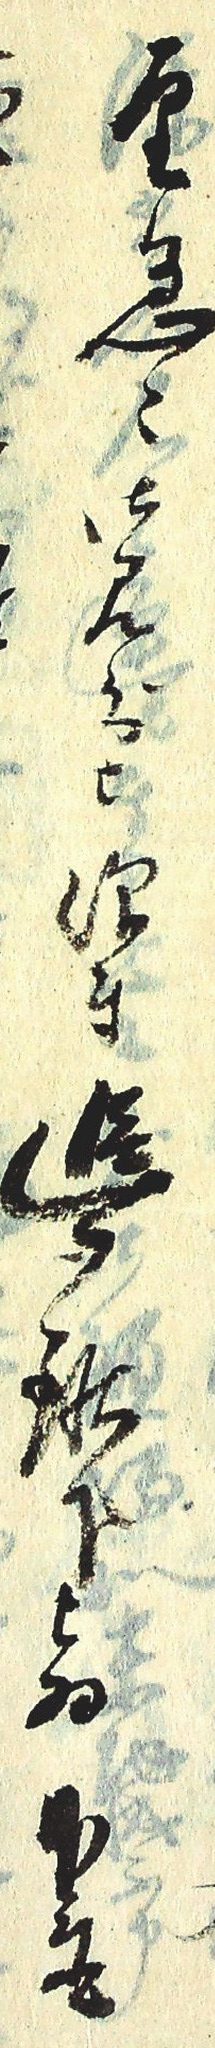届急々御見分被仰付追御鍬下被為下置
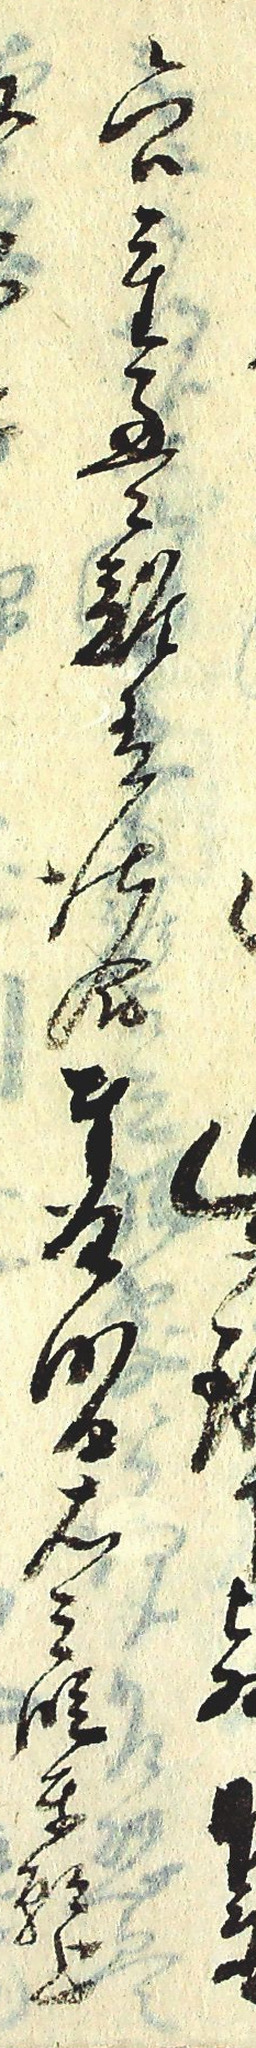候はゝ重畳難有仕合奉存仍て右之段奉願上
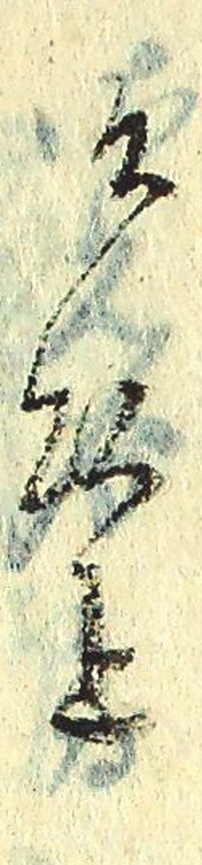候以上
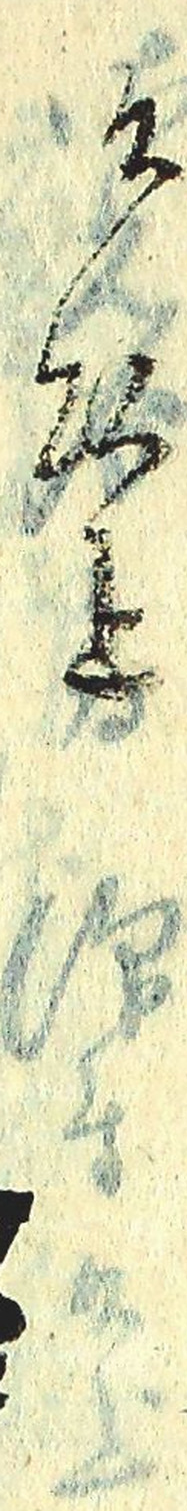候以上
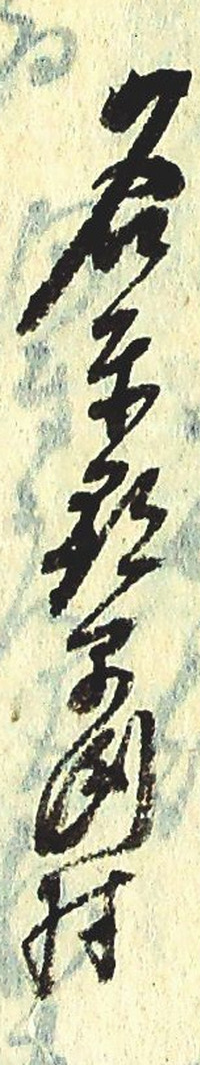名東郡早淵村
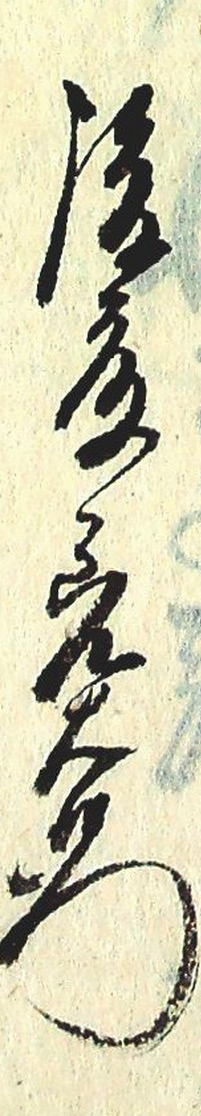後藤善右衛門
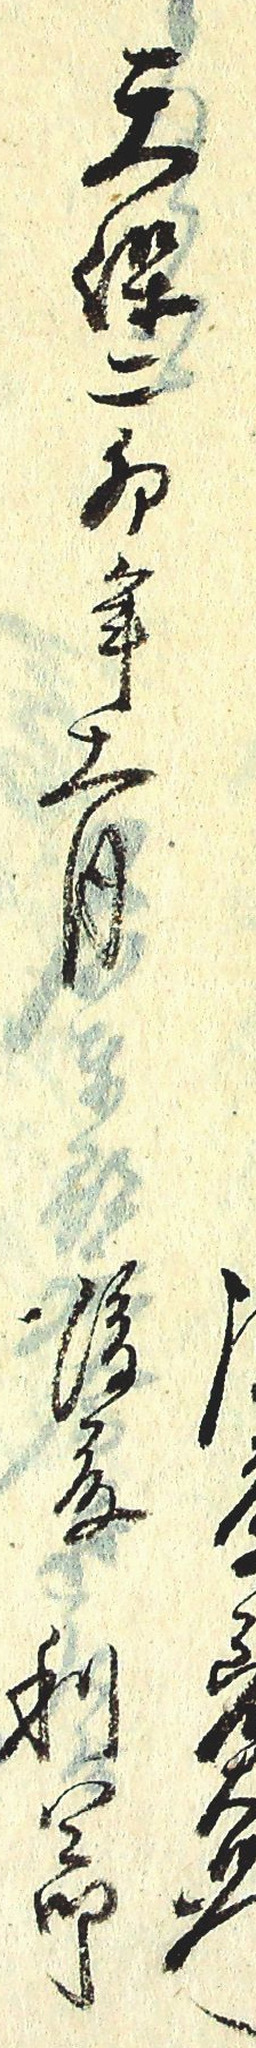天保二卯年十一月後藤利八郎
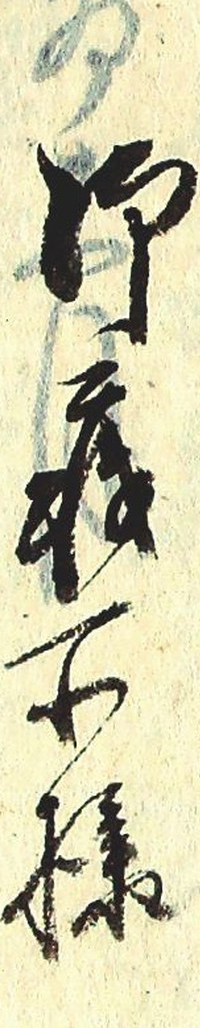御蔵所様

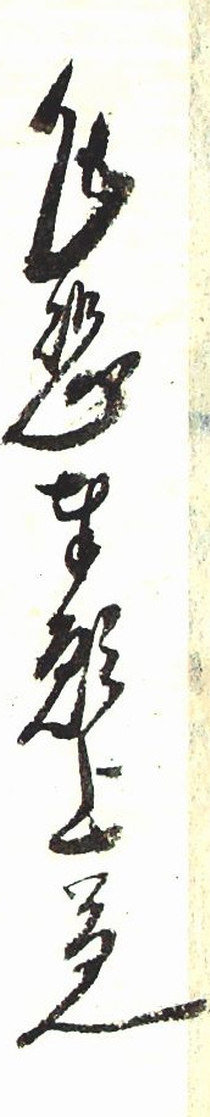乍恐奉願上覚
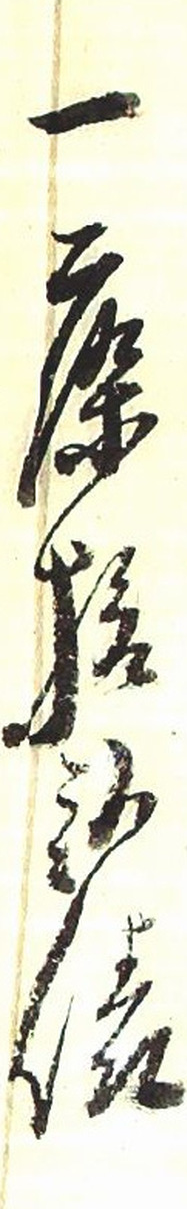一蒅拾弍俵
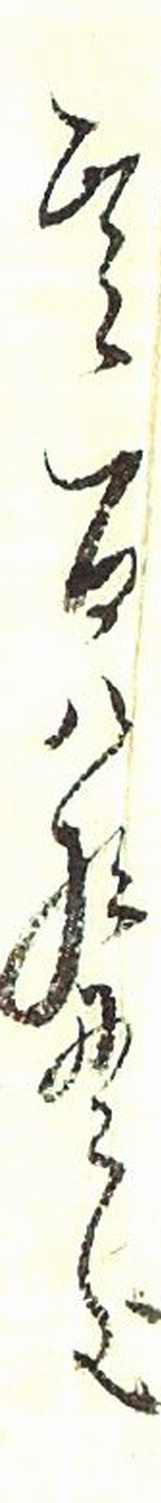正み百八拾貫匁
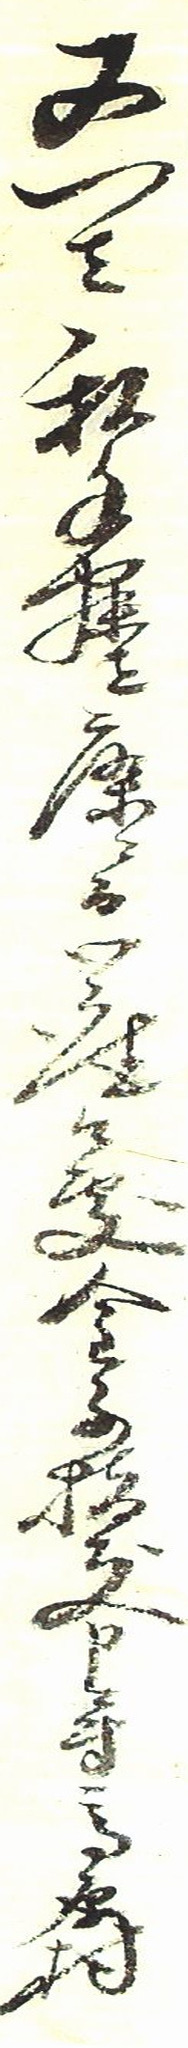右は私手寐せ蒅にて御座候処金子指支申に付高原村
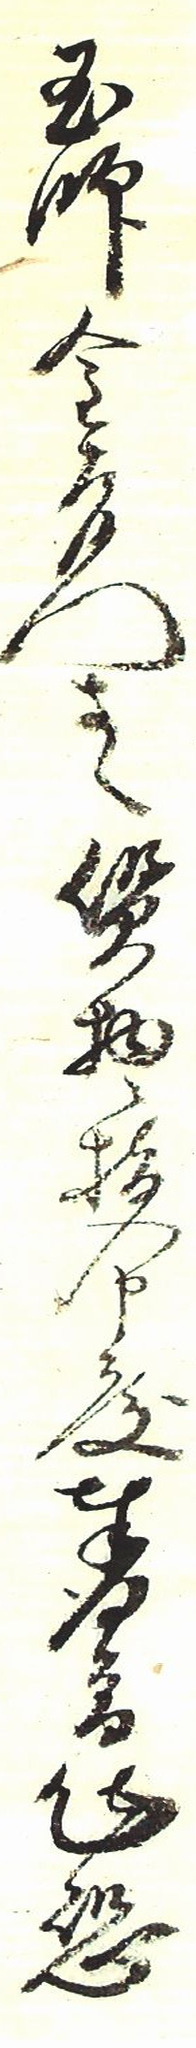玉師金左衛門方へ質物に指入申度奉存候間乍恐
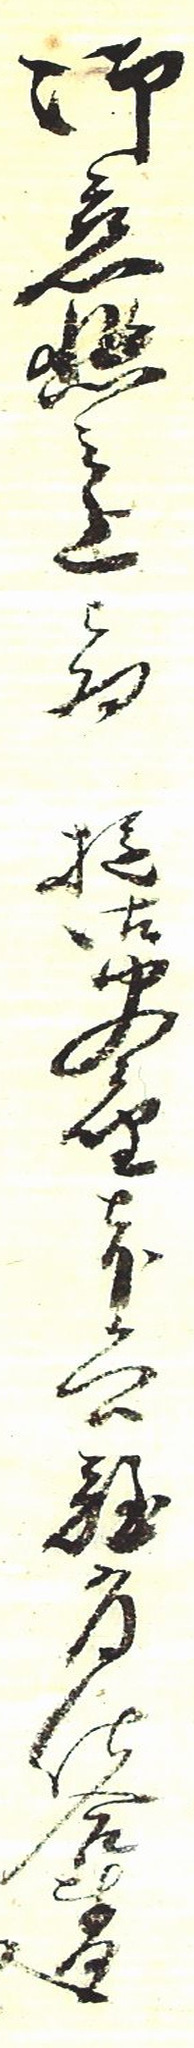御慈悲之上被為遊御聞届被下候へは難有仕合奉存候
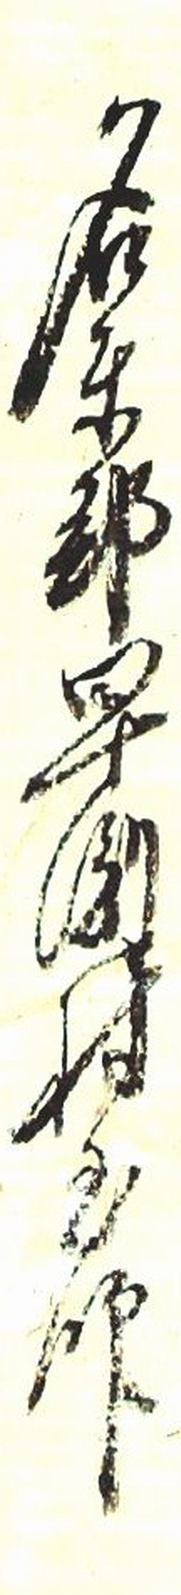名東郡早淵村玉師
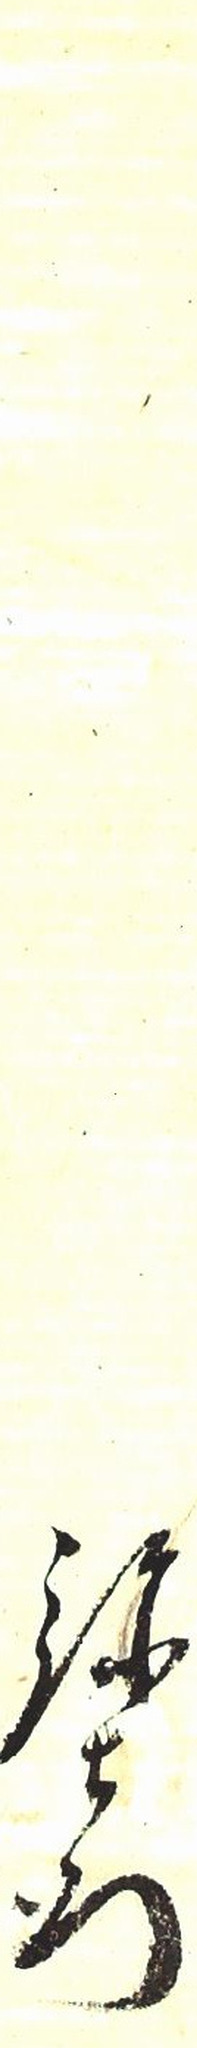弥右衛門
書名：諸御願書控(弐番）
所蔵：鳴門教育大学 Naruto University of Education
